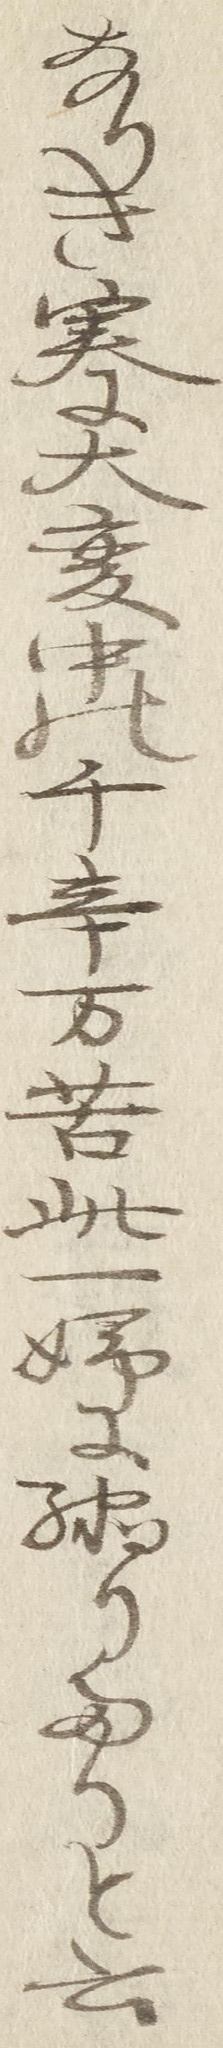なりき実に大変中の千辛万苦此一婦に縮りたりと云
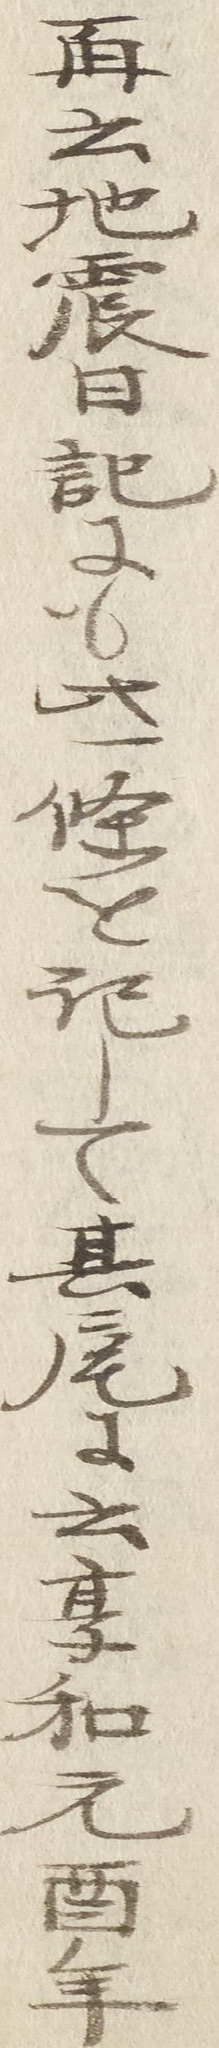再云地震日記にも此一條を記して其尾に云享和元酉年
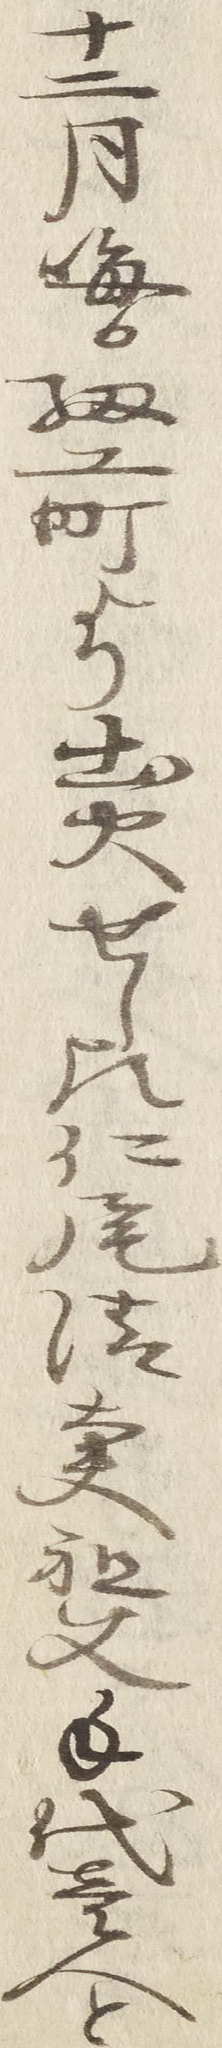十二月晦日細工町より出火せし頃仁尾清大夫祖父手代壱人と
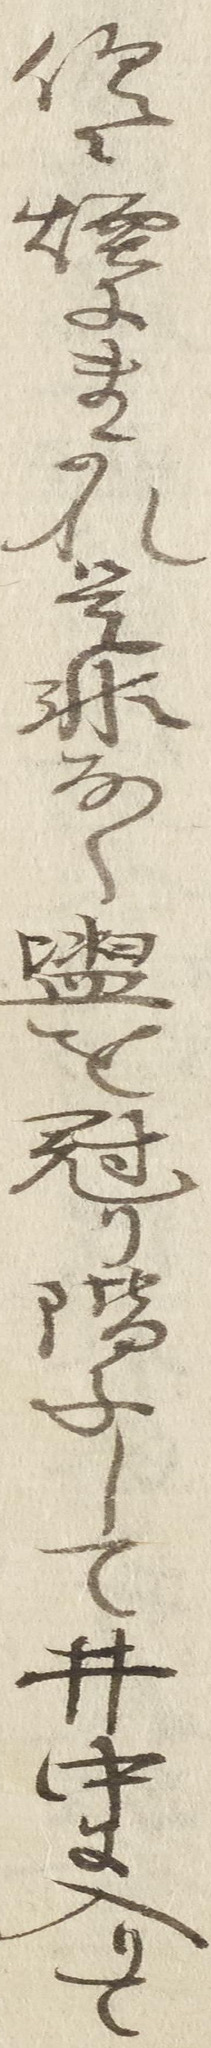倶々煙にまかれ是非なく盥を冠り階子して井中に入りて
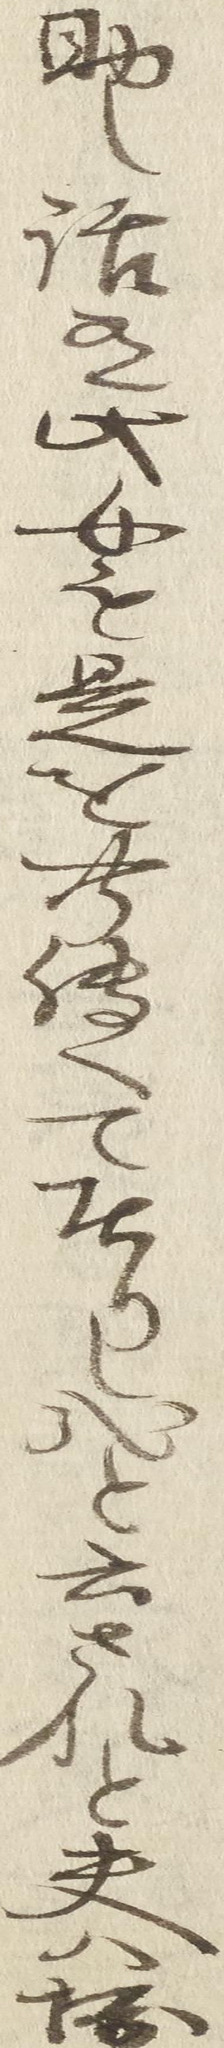助し話有此女も是聞傳へて居りし哉と云されと夫は掘
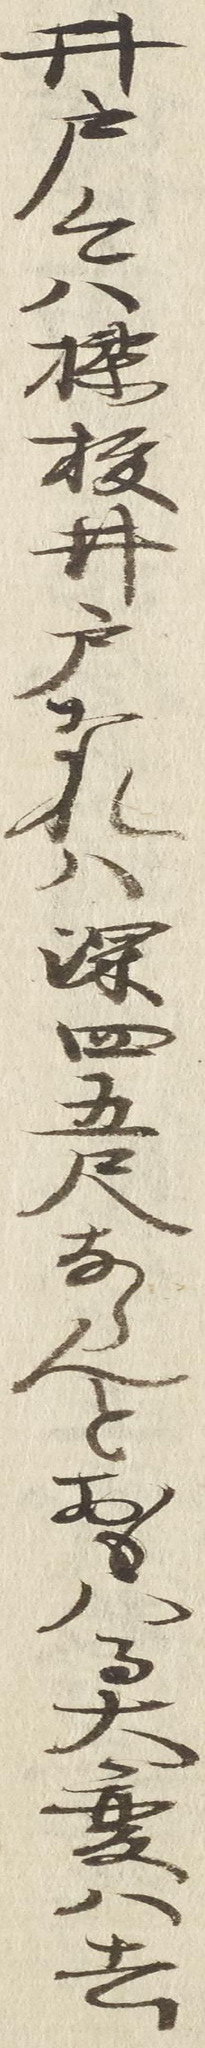井戸今は揉抜井戸なれは深四五尺ならんとおもはる大変は去
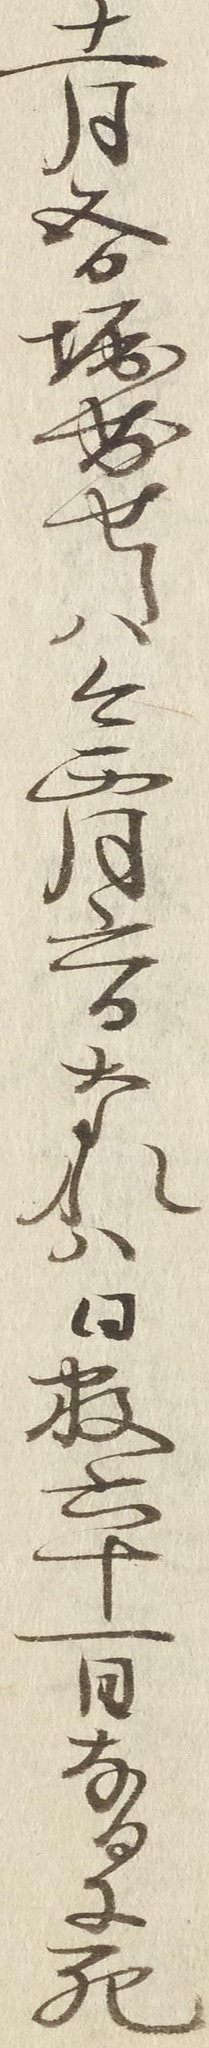十一月五日掘出せしは今正月六日なれは日数六十一日なるに死
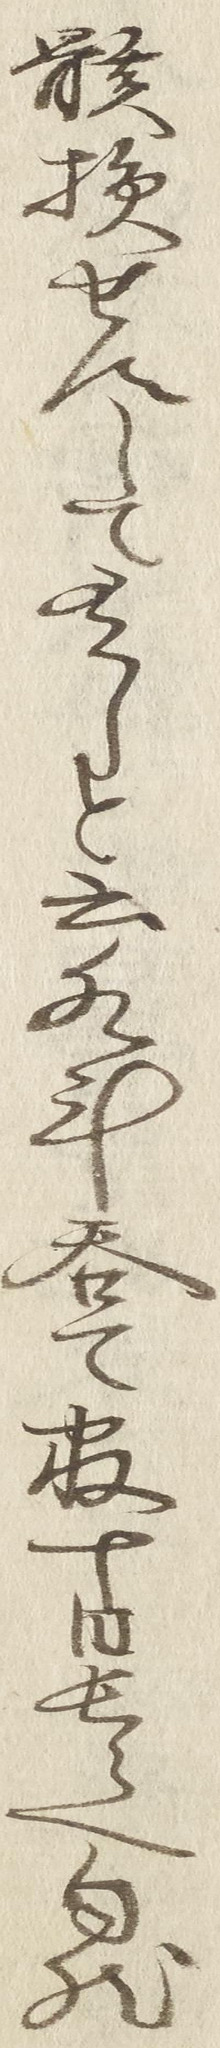骸損せすして有しと云水斗吞て数十日長らへ自然
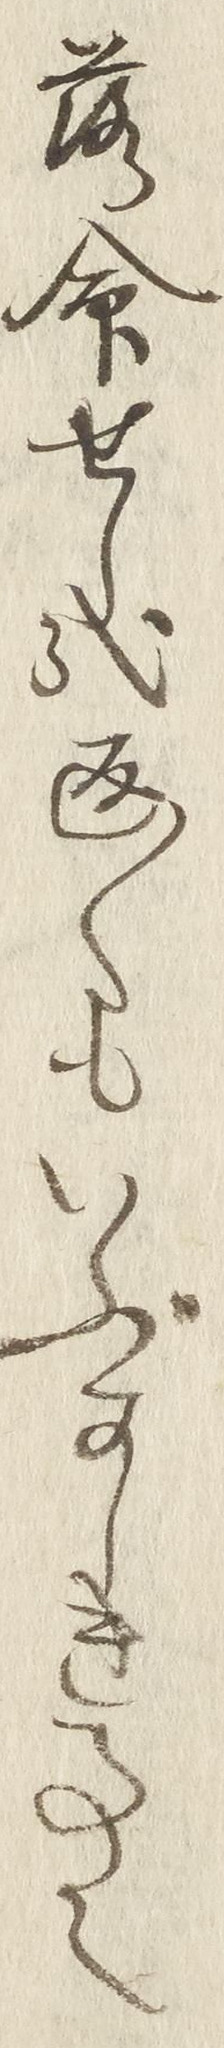落命せし哉返々もいぶかしき事也
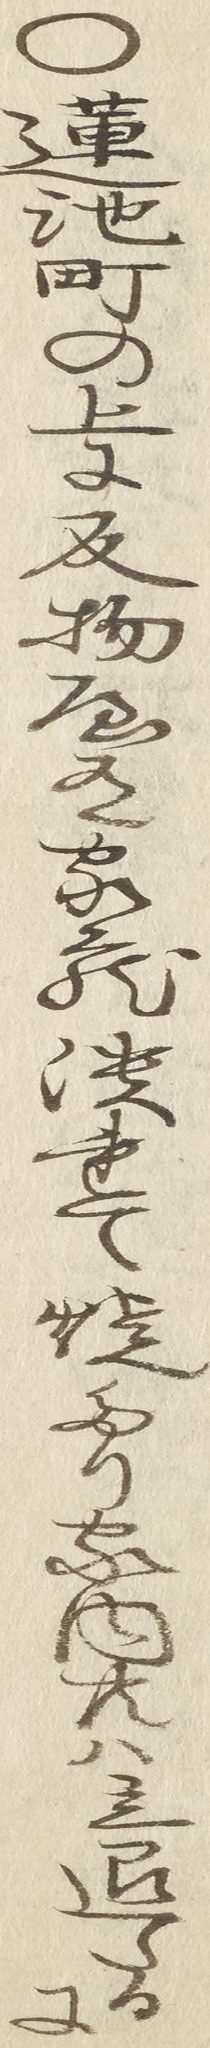〇蓮池町の上に反物屋有家蔵潰れて焼たり家内共は立退たるに
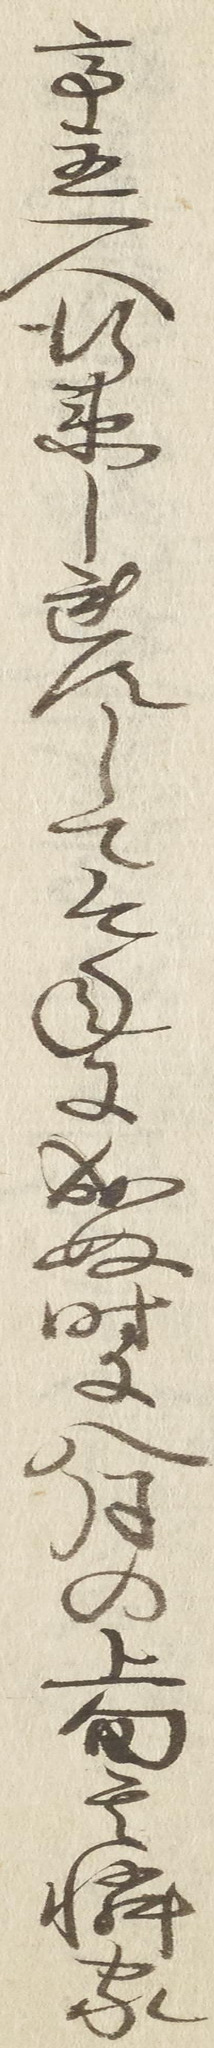亭主一人行衛しれすして今年に成ぬ時に八月の上旬其隣家
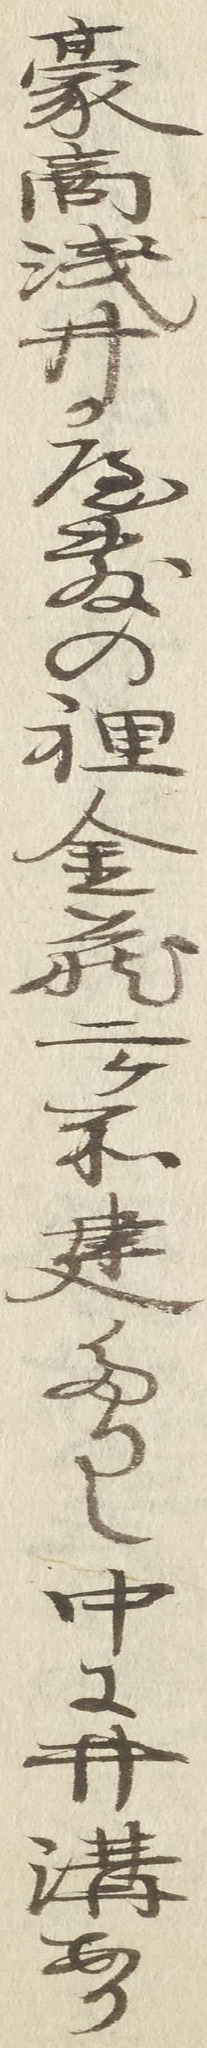豪商浅井の屋敷の裡金蔵二ヶ所建たりし中に井溝あり
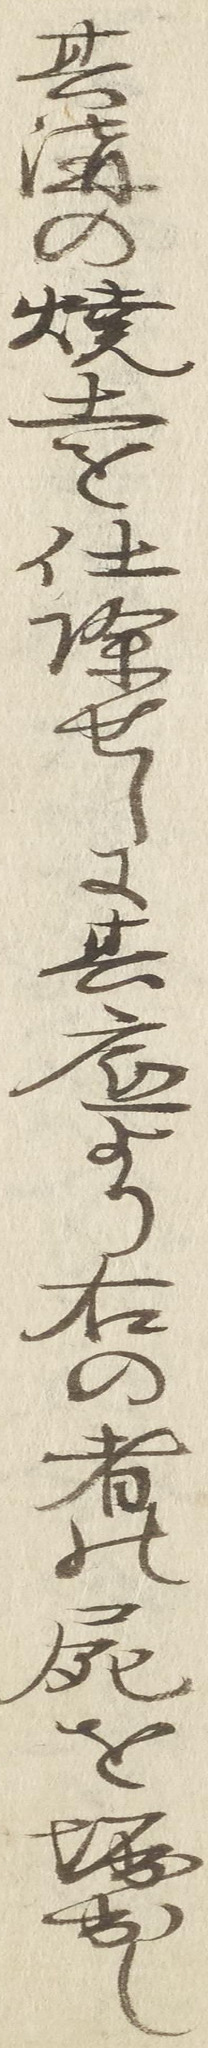其溝の焼土を仕除せしに其底より右の者の屍を掘出し
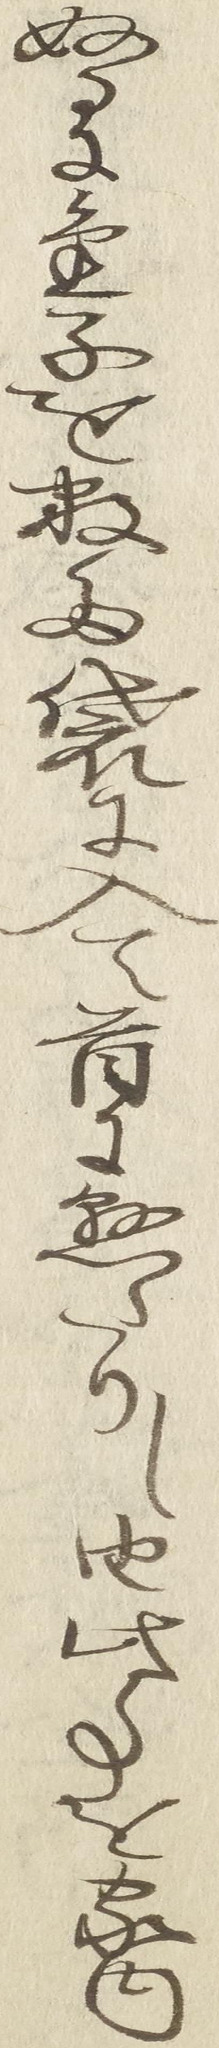ぬるに金子を数多袋に入て首に懸たりし由此事を家内
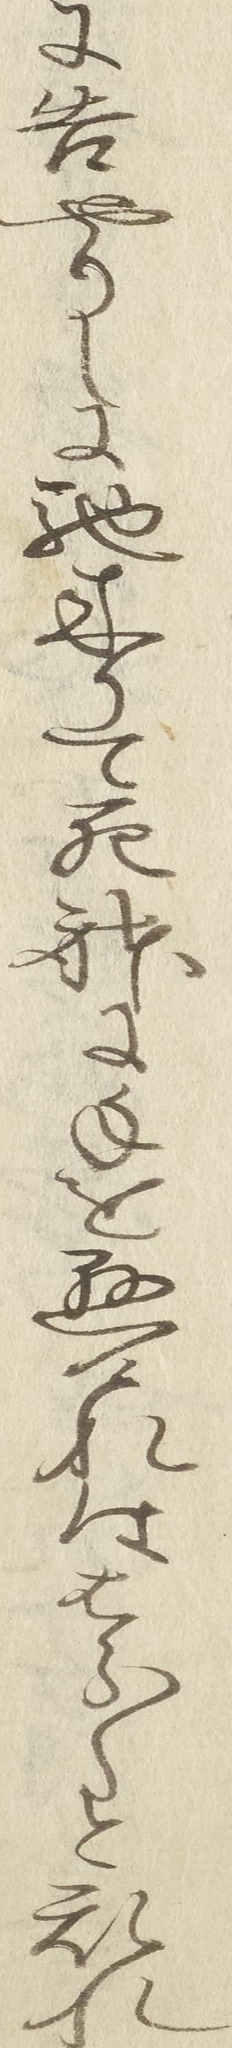に告やりしに馳来りて死体に手を懸ければはら〳〵と乱れ

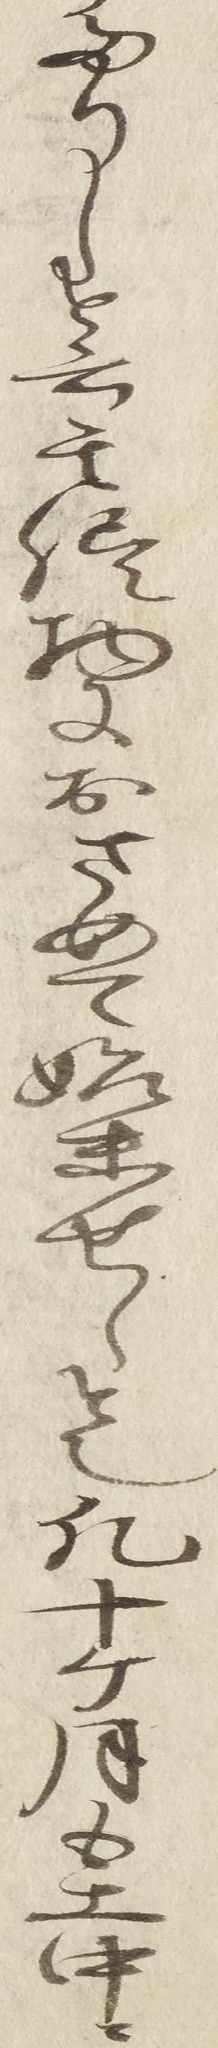たりしと云其侭物におさめて始末せしと也凡十ヶ月も土中に
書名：地震記　上
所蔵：東京大学地震研究所図書室 Earthquake Research Institute Library, The University of Tokyo, JAPAN
